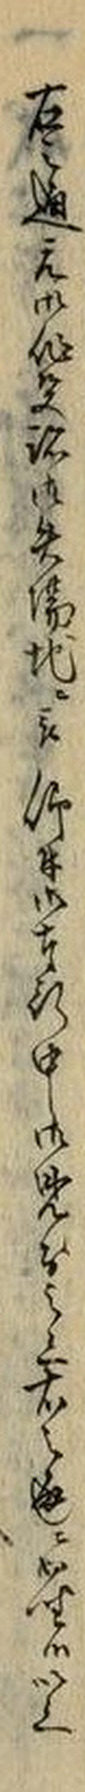右之通元御作事跡御矢場地に被仰付御奉行中御見分之上右之通に御坐候以上
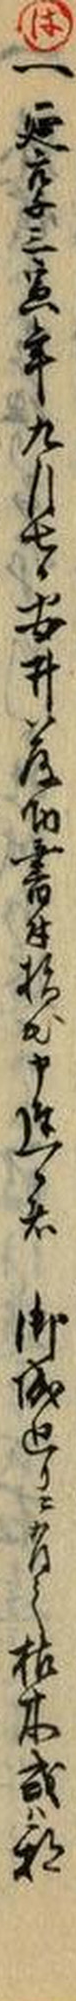○は一延享三寅年九月七日安井藤助書付指出申達候者御城廻りに有之枯木或は邪
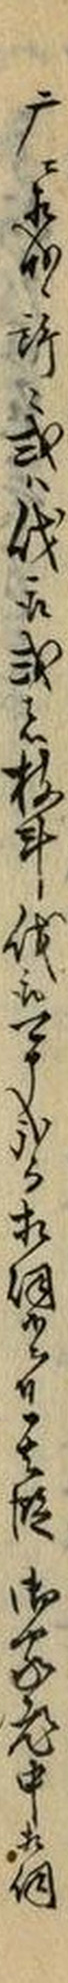魔に相成候所々或は伐取或は枝斗伐取可申哉と相伺候に付其段御家老中相伺
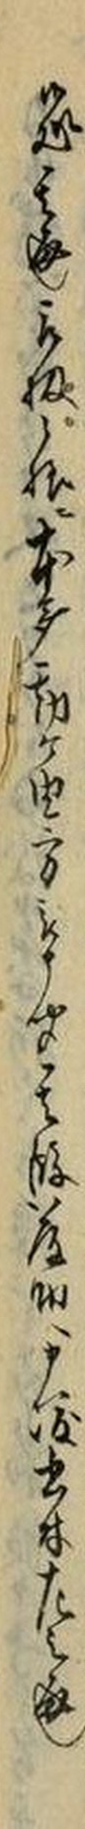候処其通取扱候様に本多勘ケ由方被申聞其段藤助へ申渡書付左之通
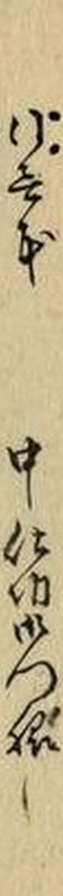同壱本中仕切御門脇
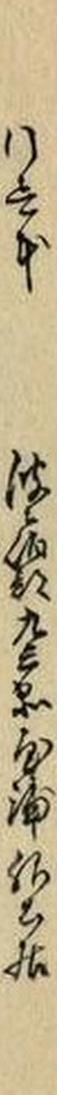同壱本波々伯部九兵衛屋舗脇土居
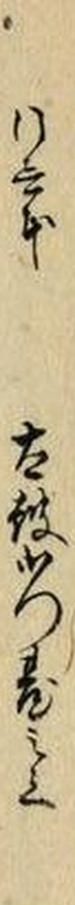同壱本太皷御門台之上
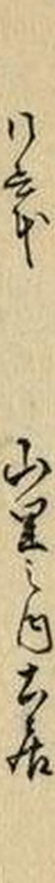同壱本山里之内土居
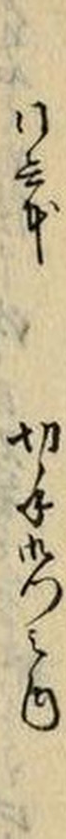同壱本切手御門之内
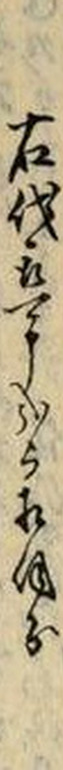右伐取可申哉と相伺分
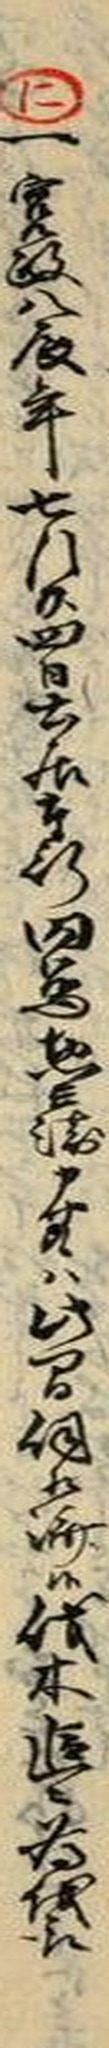○に一寛政八辰年七月廿四日土居奉行田島惣兵衛申聞候は此間伺相済候伐木追々為伐取
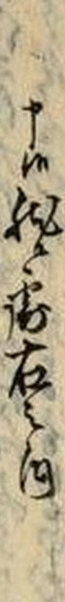申候然ル処右之内
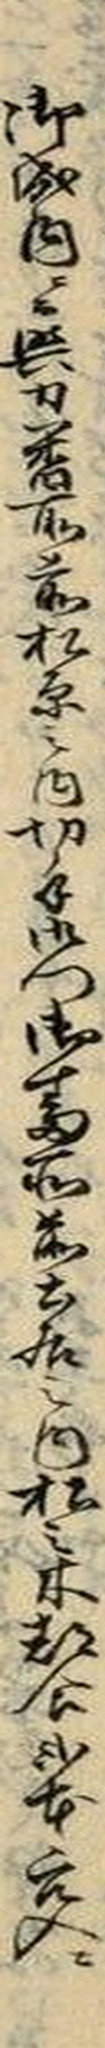御城内にて与力番所前松原之内切手御門御番所前土居之内松之木都合弐本穴入に
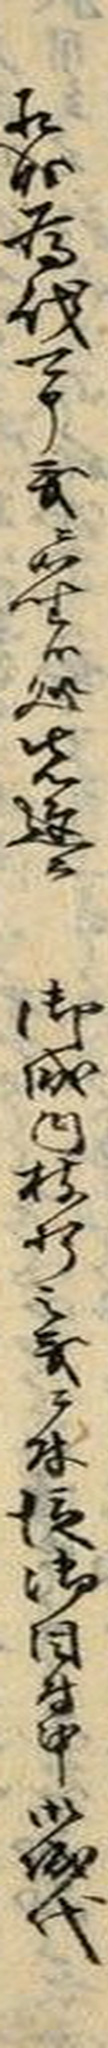相成為伐可申義に御坐候処先達て御城内枝打之義に付従御目付中御城代
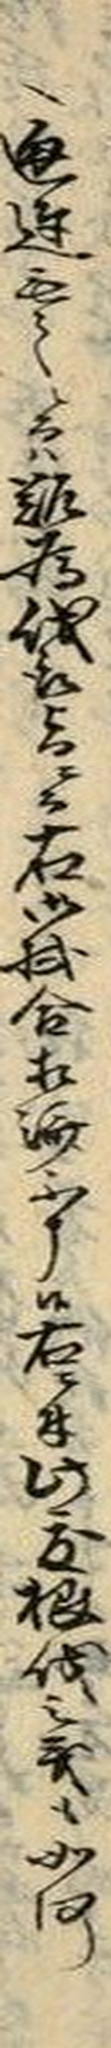へ通達無之候ては難為伐取旨にて右御掛合相済不申候右に付此度根伐之義も如何
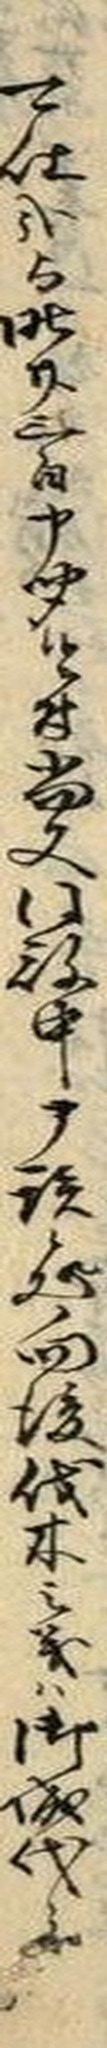可仕哉と昨廿三日申聞候に付尚又同役中申談候処向後伐木之義は御城代え
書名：御城下諸事之部
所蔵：福井県文書館 Fukui Prefectural Archives
